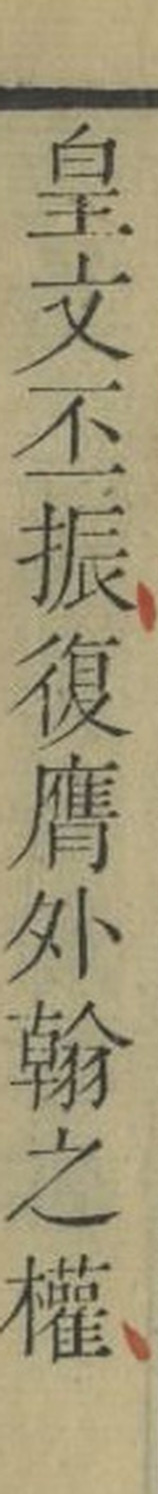皇文丕振復膺外翰之權
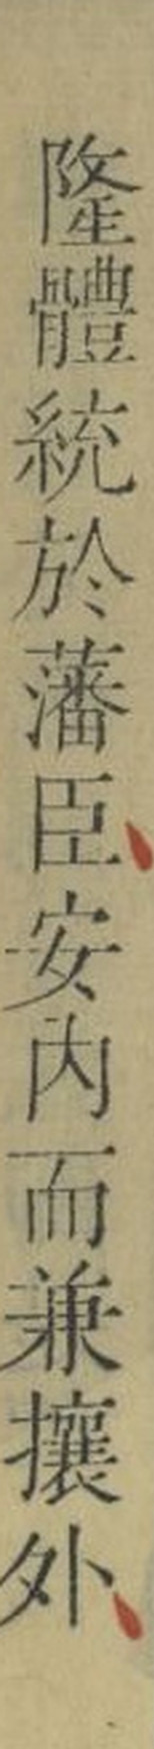隆體統於藩臣安内而兼攘外

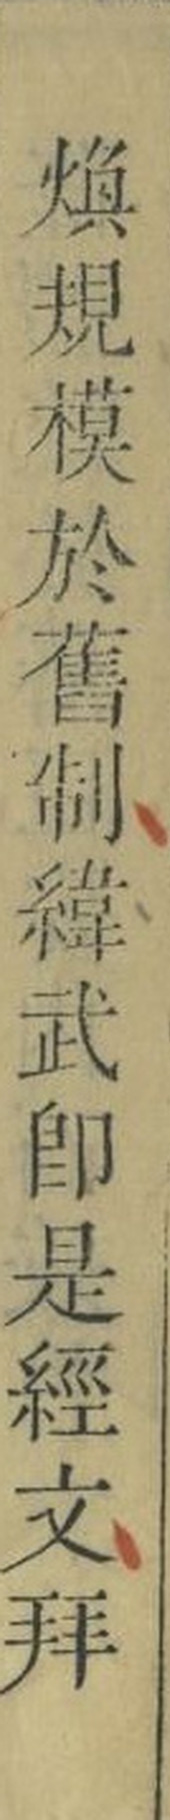煥規模於舊制緯武卽是經文拜
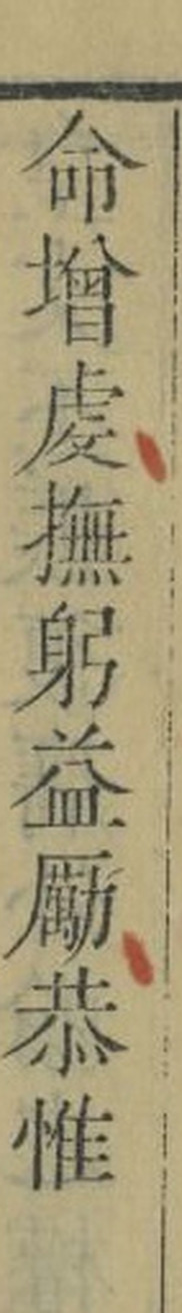命增虔撫躬益勵恭惟
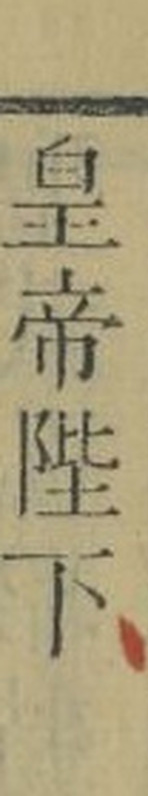皇帝陛下
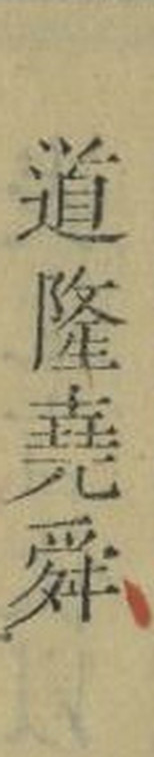道隆堯舜
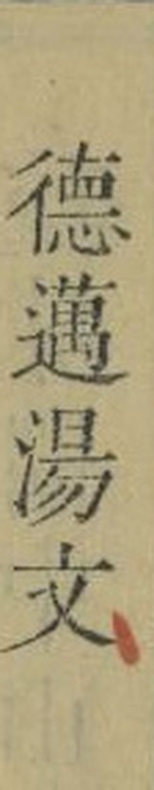德邁湯文
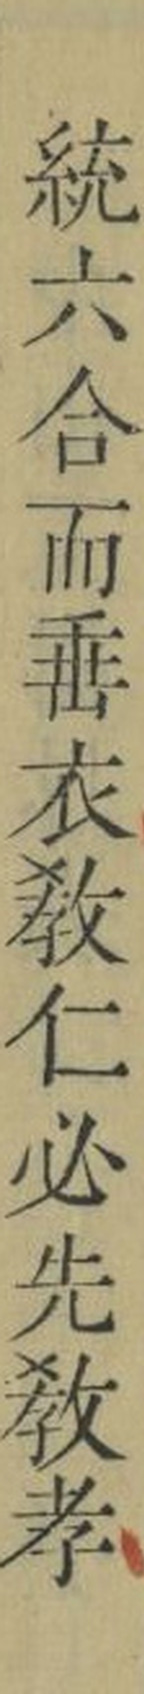統六合而垂衣敎仁必先敎孝
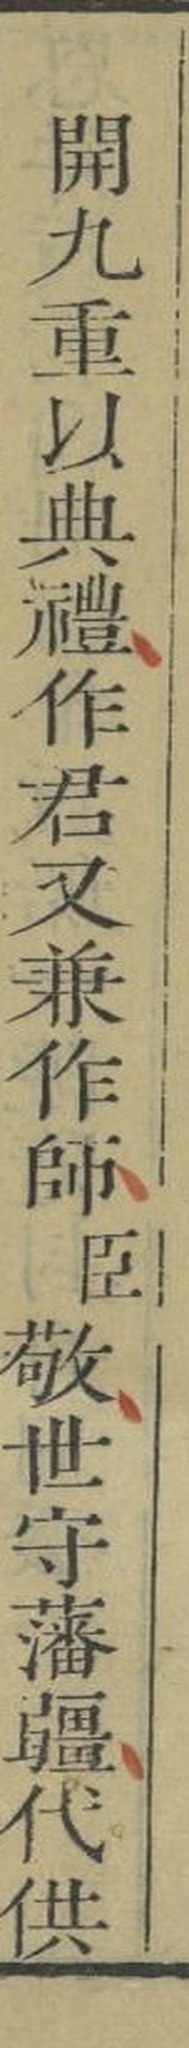開九重以典禮作君又兼作師臣敬世守藩疆代供
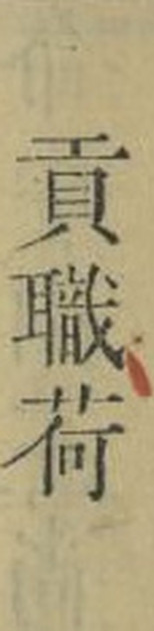貢職荷
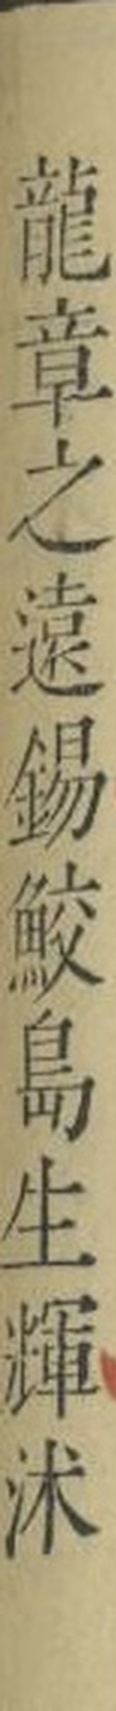龍章之遠錫鮫島生輝洣
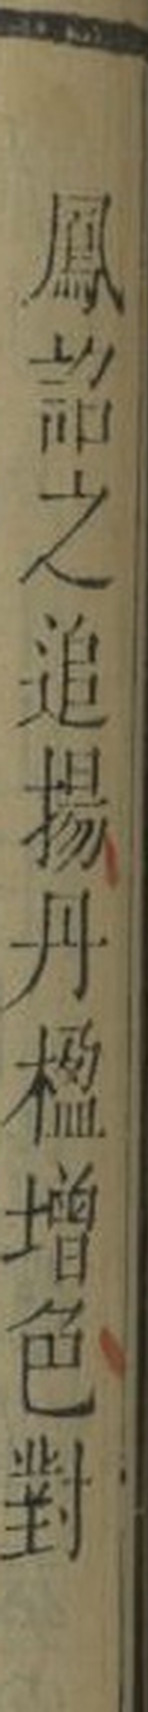鳳詔之追揚丹楹增色對
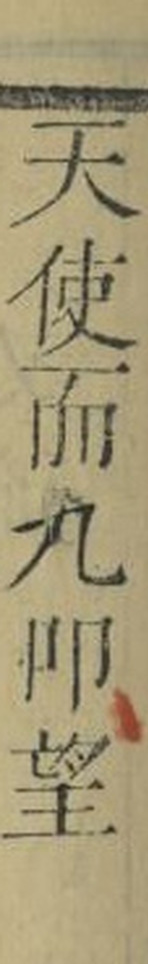天使而九叩望
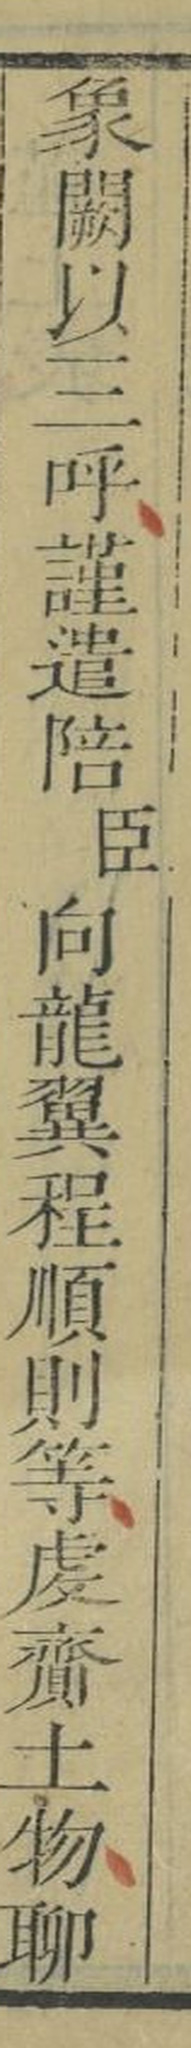象闕以三呼謹遣陪臣向龍翼程順則等虔齎土物聊
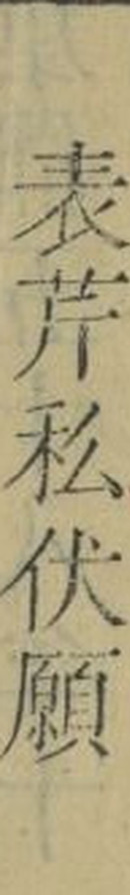表芹私伏願
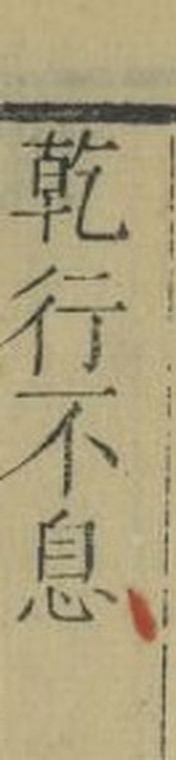乾行不息
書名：中山伝信録 巻一、巻二
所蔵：University of the Ryukyus Library
